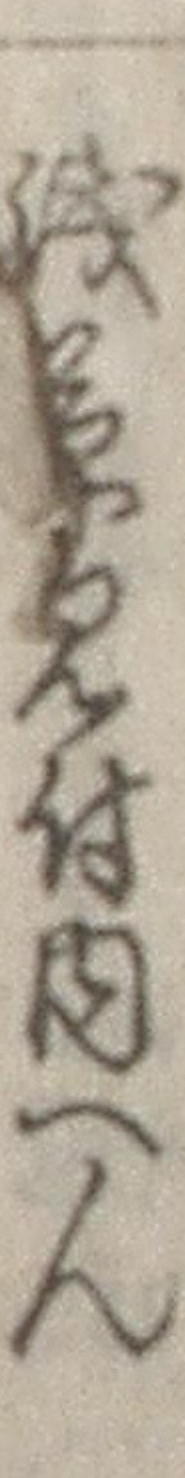十浅草見付内へん
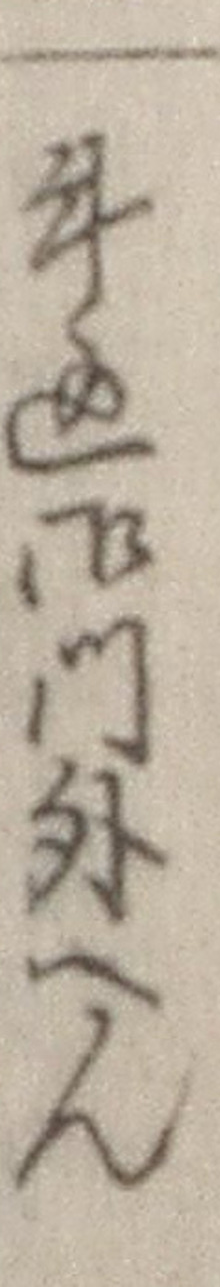十三牛込御門外へん
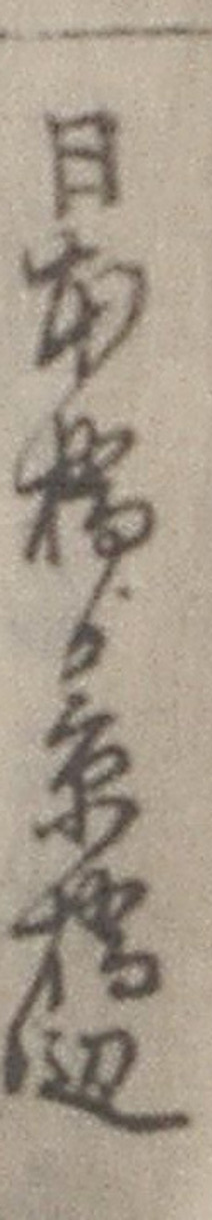十八日本橋ゟ京橋辺
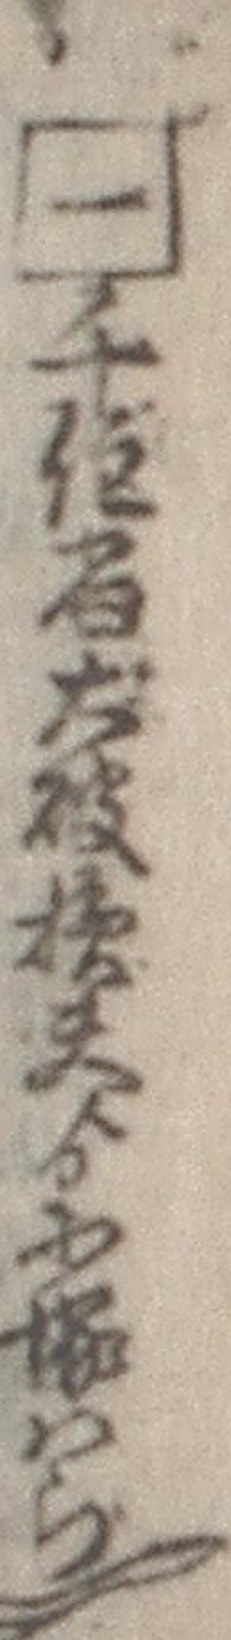一千住者大破損夫ゟ小塚ハら
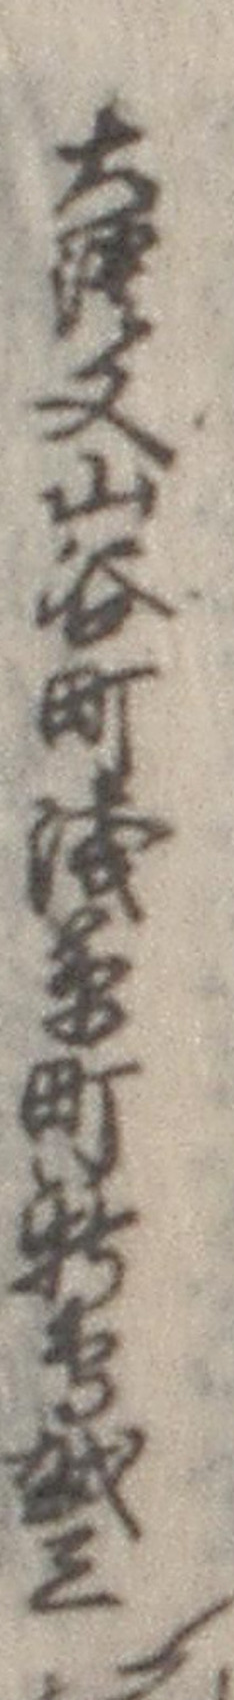大潰又山谷町浅草町新鳥越三
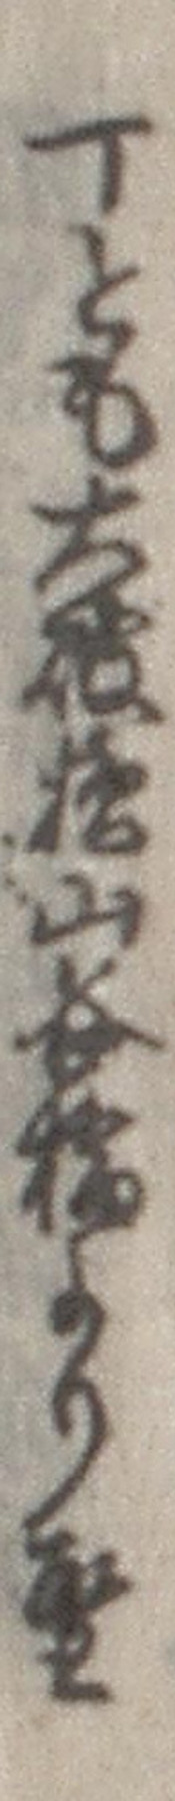丁とも大破損山谷橋より聖
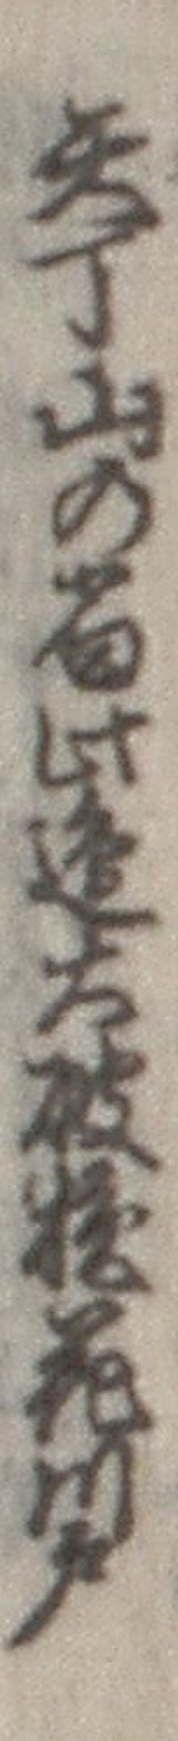天丁山の者此邊大破損花川戸
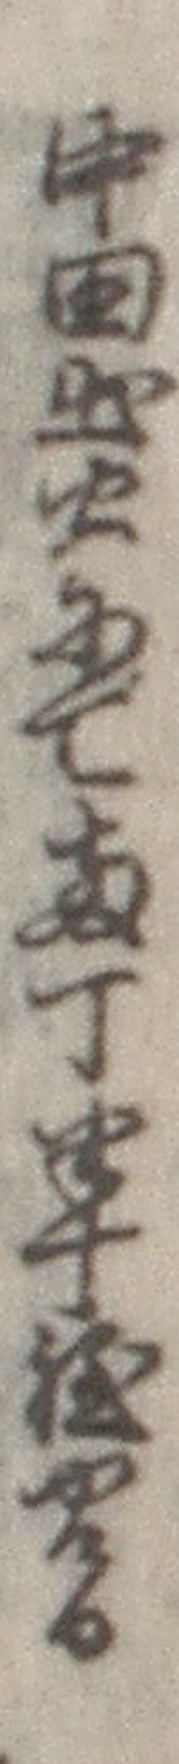中田出火にて両丁半丁程やける
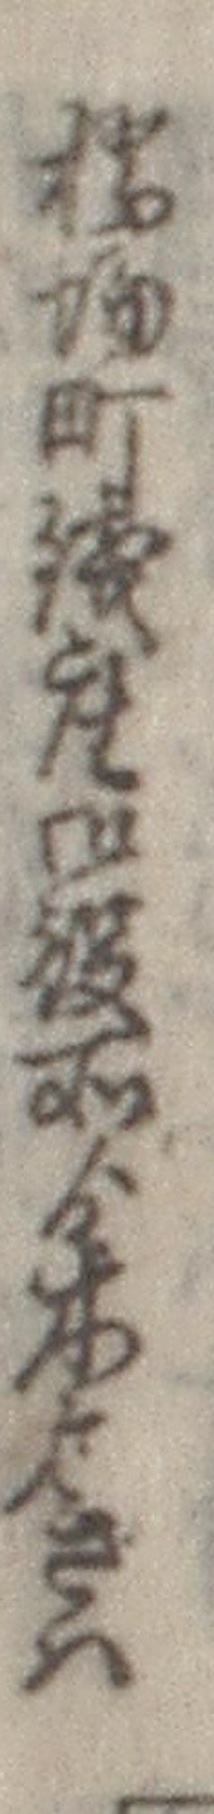橋場町銭座御役所ゟ木戸さハ
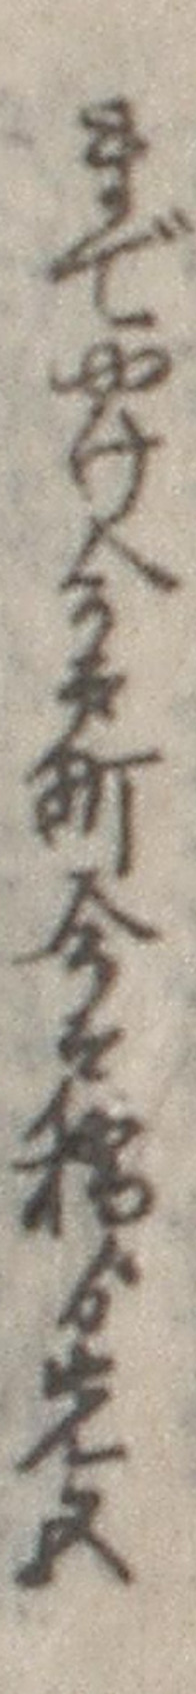までやけ今戸町今戸橋ゟ先五
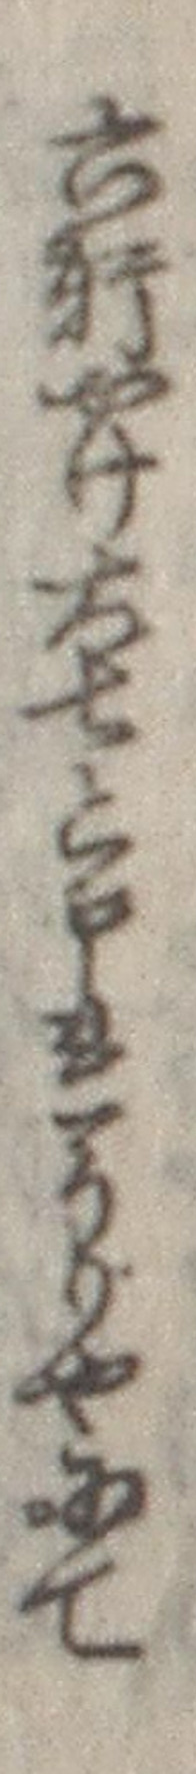六軒やけ六七迄申れうりやにて
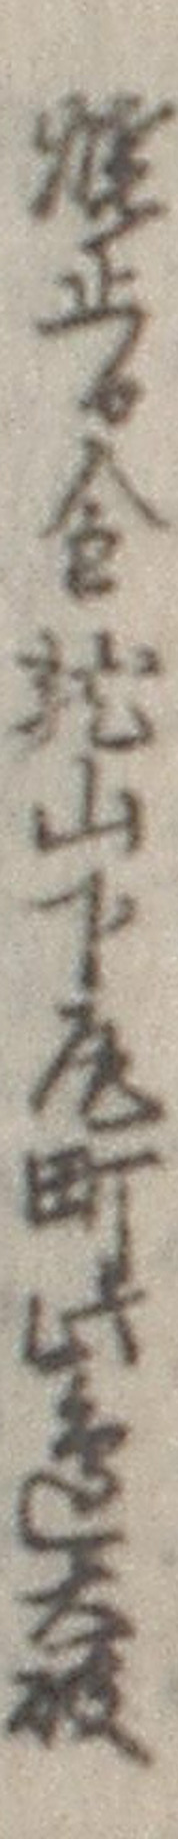焼止る金龍山下尾町此邊大破
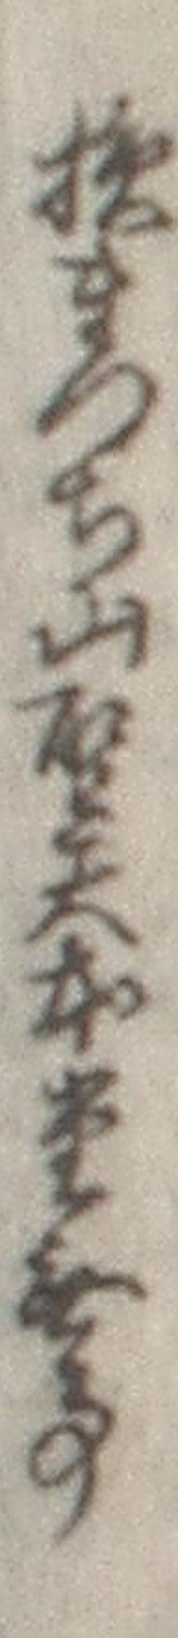損まつち山聖天本堂無事
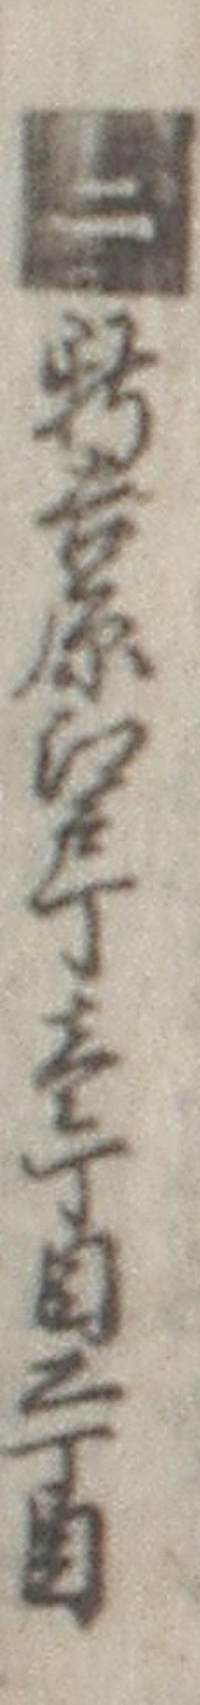二新吉原郷戸丁壱丁目二丁目
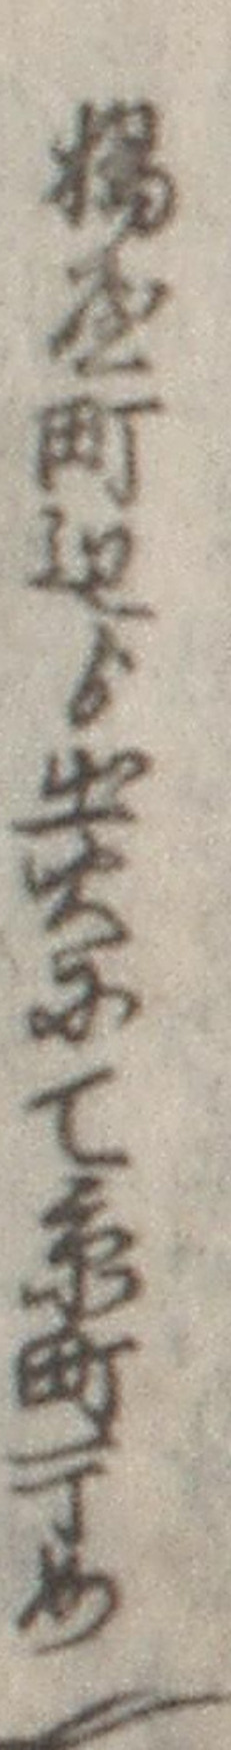揚屋町辺ゟ出火にて糸町一丁め
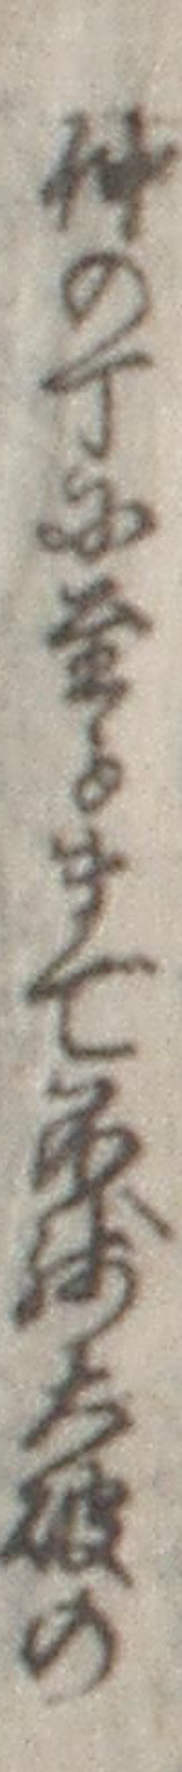仲の長に至るまで不残大破の
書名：江戸　大地震臣細録　全
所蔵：東京大学地震研究所図書室 Earthquake Research Institute Library, The University of Tokyo, JAPAN
